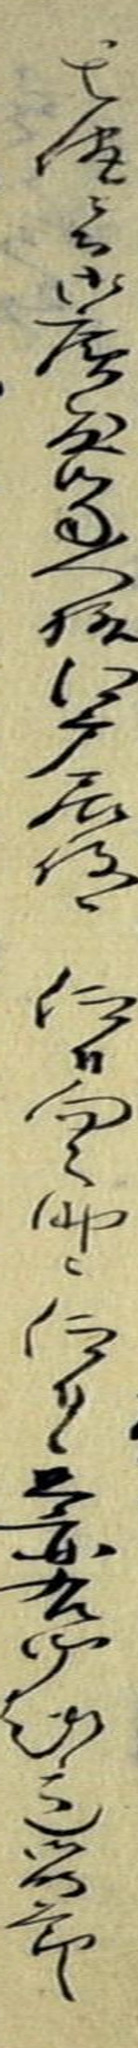其侭に而御広敷御用人格江戸居役被仰付向々助被仰付候且亦右御趣意御時節
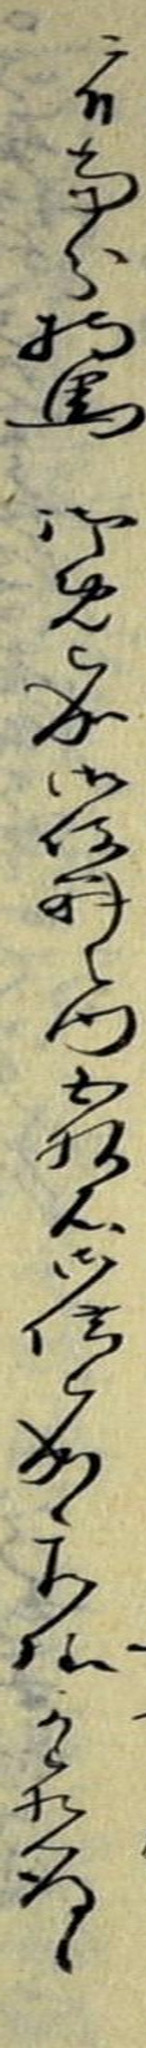に付当分持馬御免被成御役料之内五拾石御借被成候左様可被相心得候
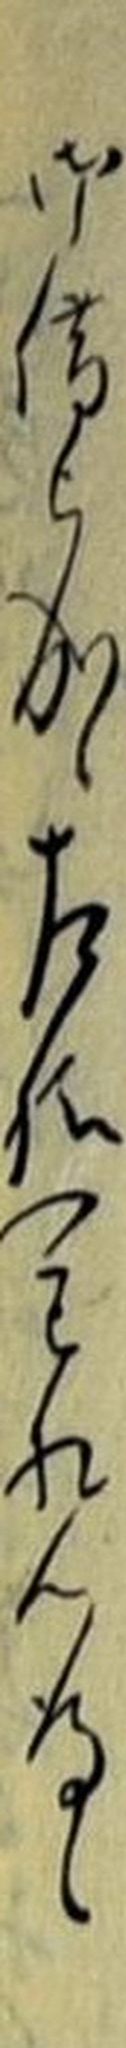御借被成候左様可被相心得候
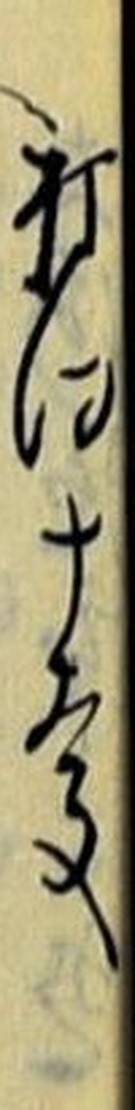村田十太夫
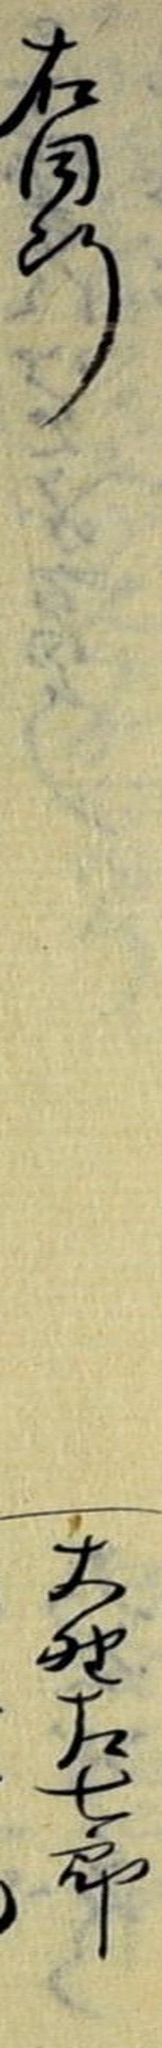右同断大野左七郎
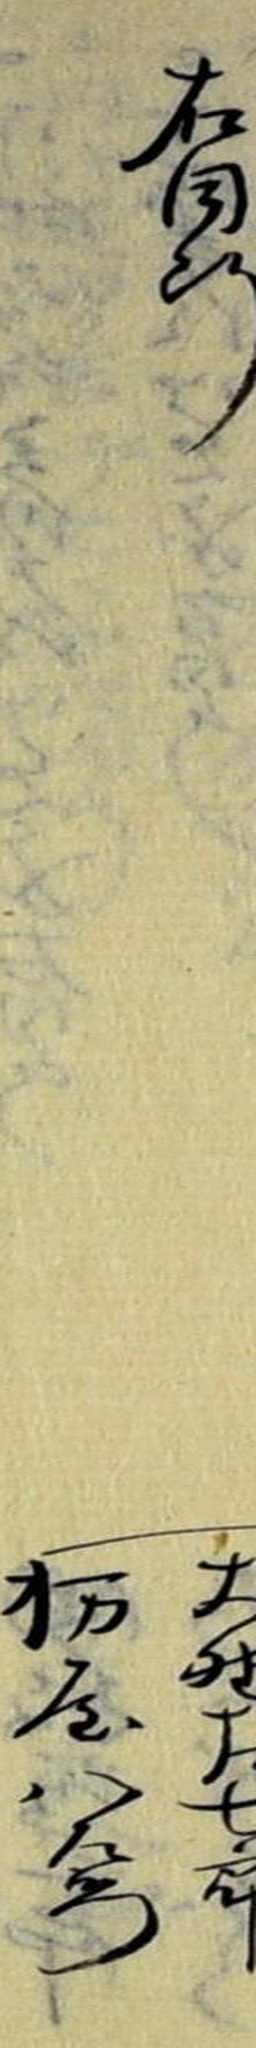栃屋八左衛門
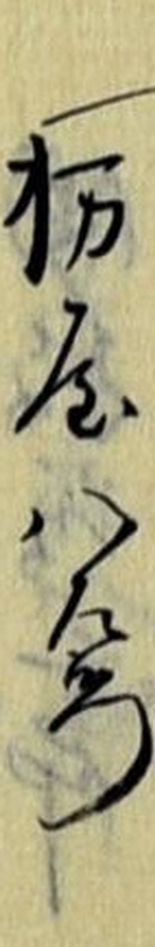栃屋八左衛門
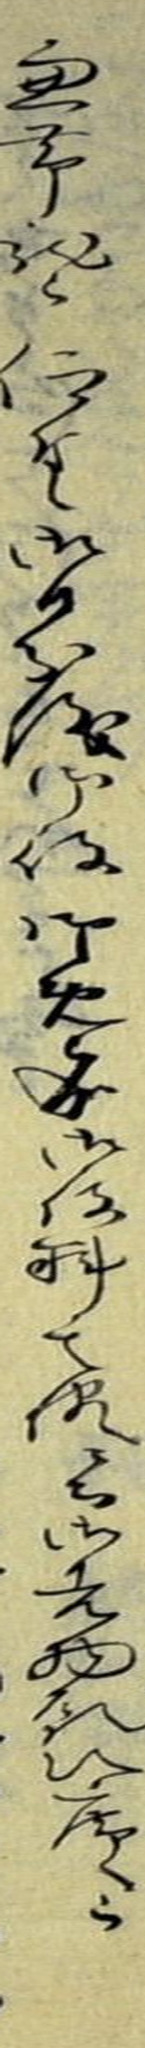兼帯然被仰付候御自分儀御役御免被成御役料其侭に而御先物頭次席へ被
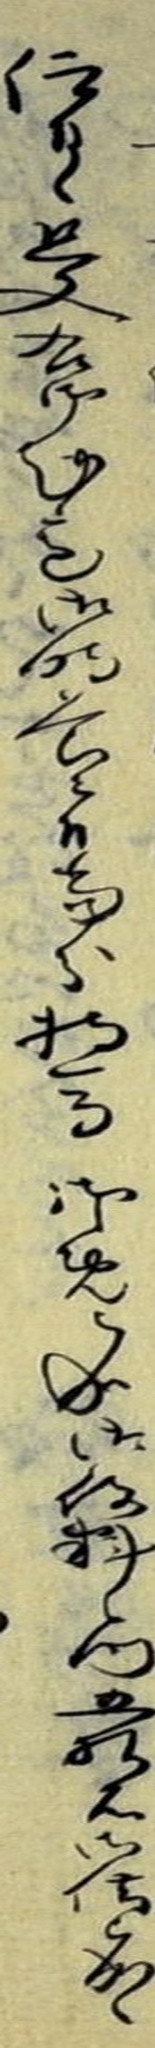仰付候且又右御趣意御時節に付当分持馬御免被成御役料之内五拾石御借被成候
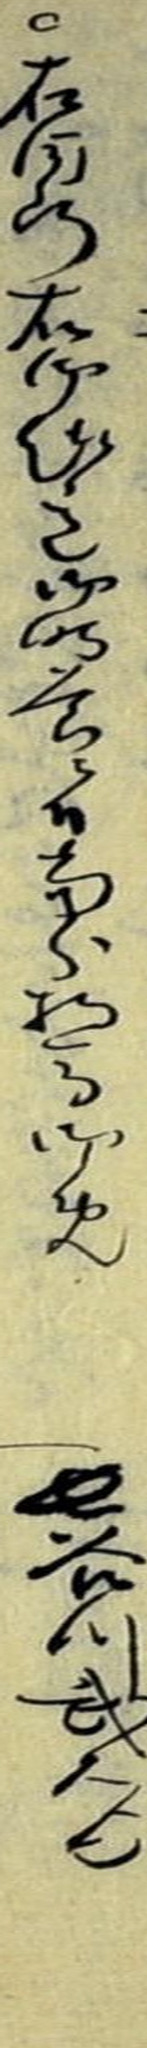〇右同断右御趣意御時節に付当分持馬御免長谷川武右衛門
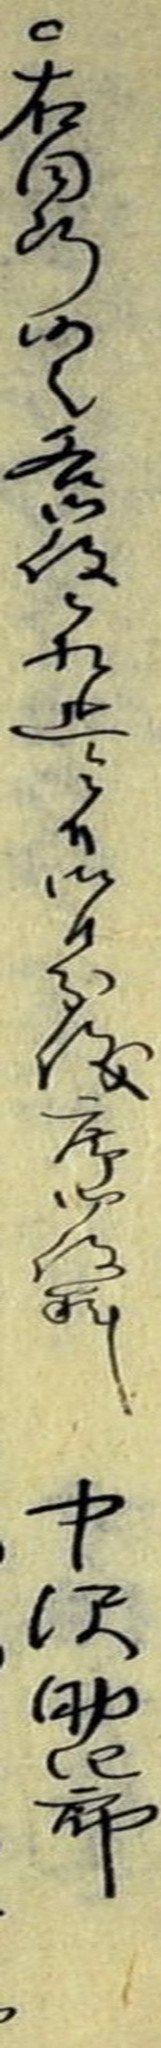〇右同断仍之右御役被相止候に付御自分儀席御役料中沢助四郎
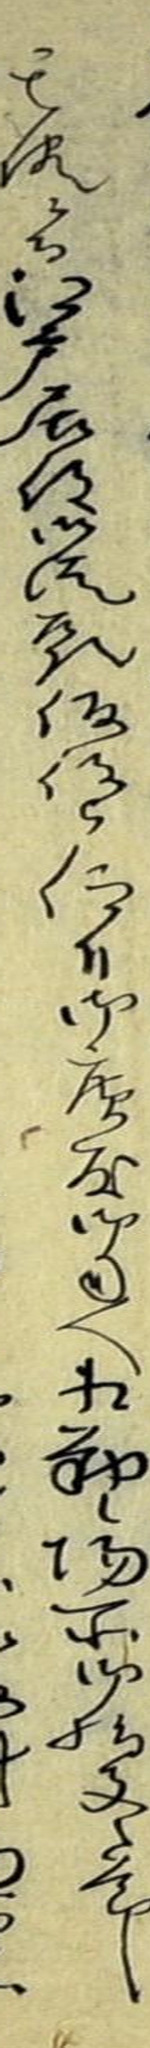其侭に而江戸居役御徒頭仮役被仰付御広敷御用人相勤候場所御指支之節
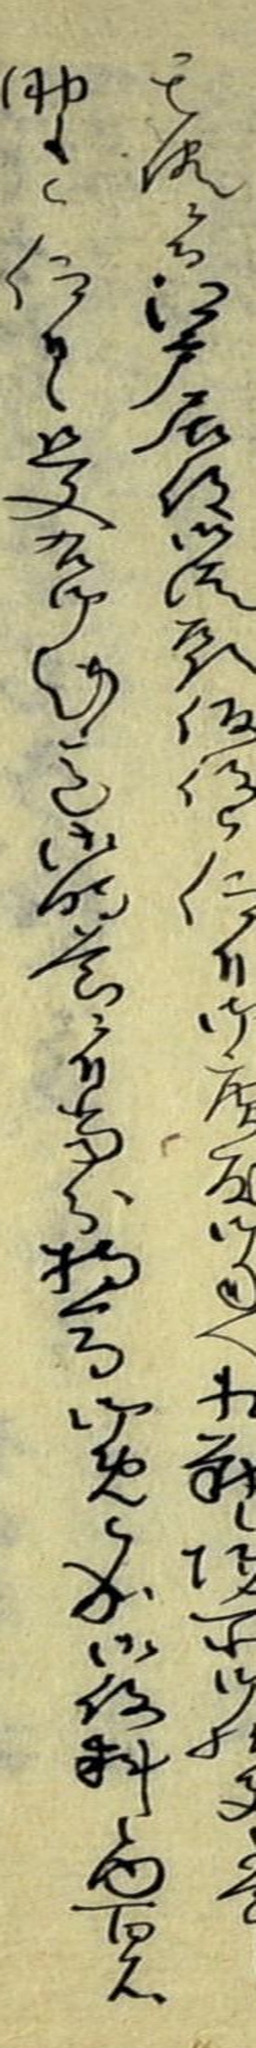助も被仰付候且又右御趣意御時節に付当分持馬御免被成御役料之内百石
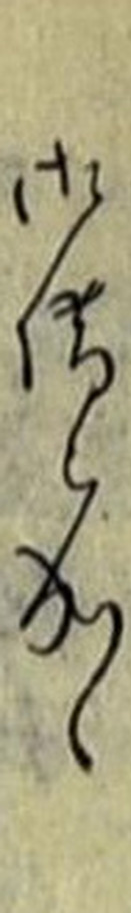御借被成候
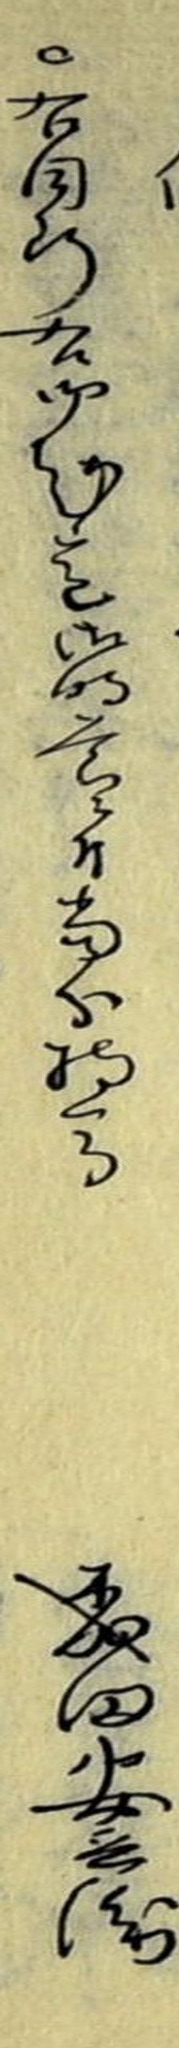〇右同断右御趣意御時節に付当分持馬森田安兵衛
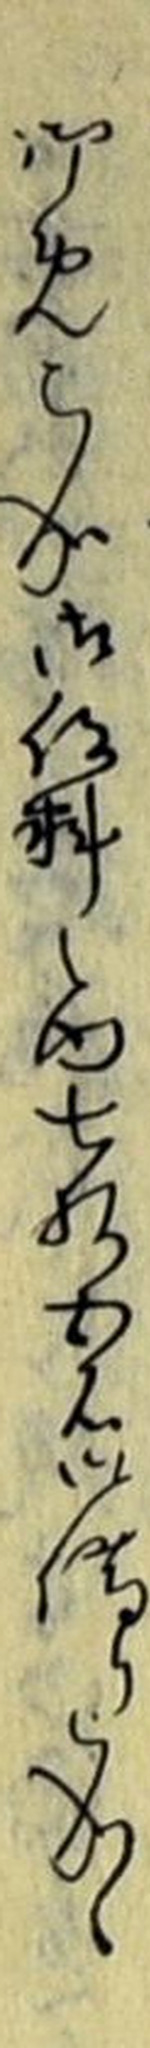御免被成御役料之内七拾五石御借り被成候
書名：命令之部 二
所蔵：福井県文書館 Fukui Prefectural Archives
